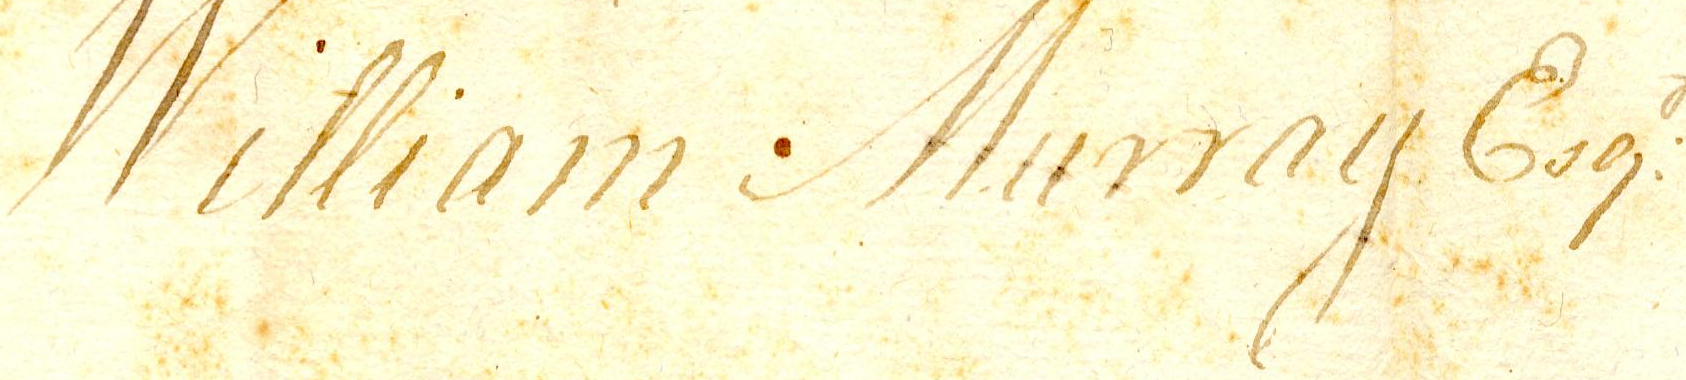William Murray Esq^r
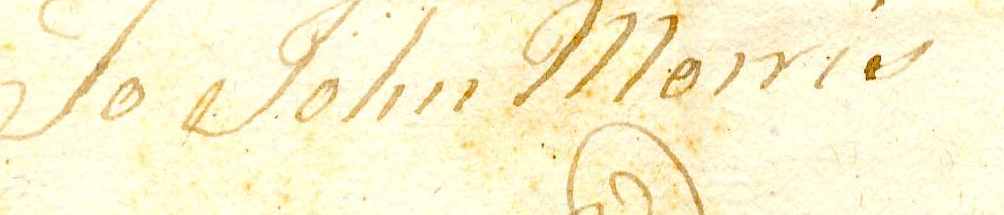To John Morris
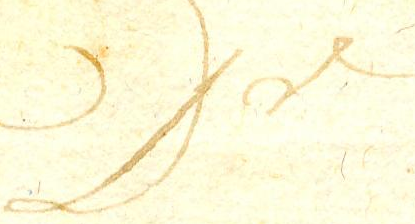D^r
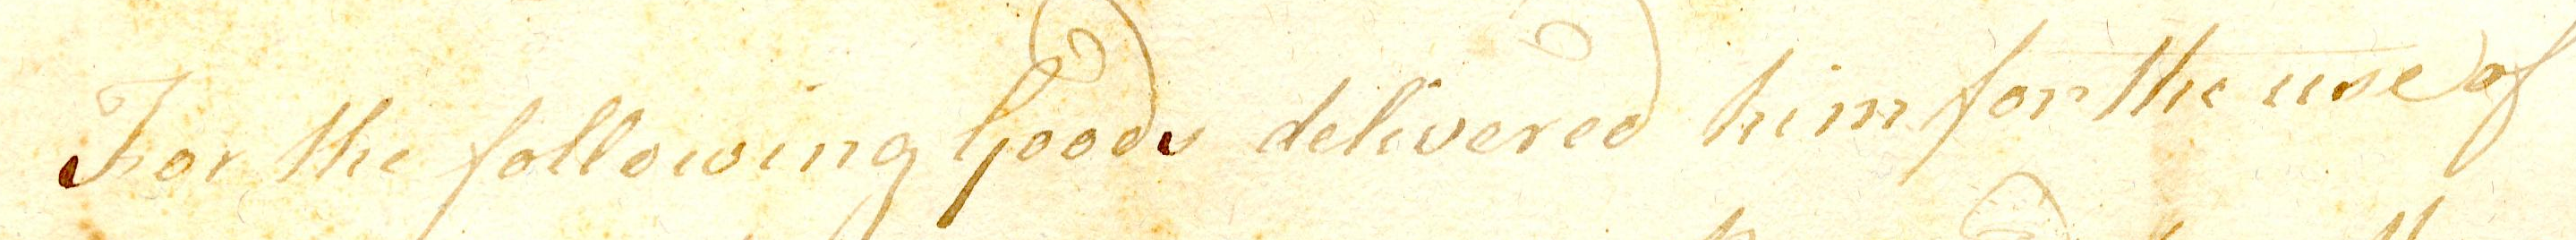For the following Goods delivered him for the use of
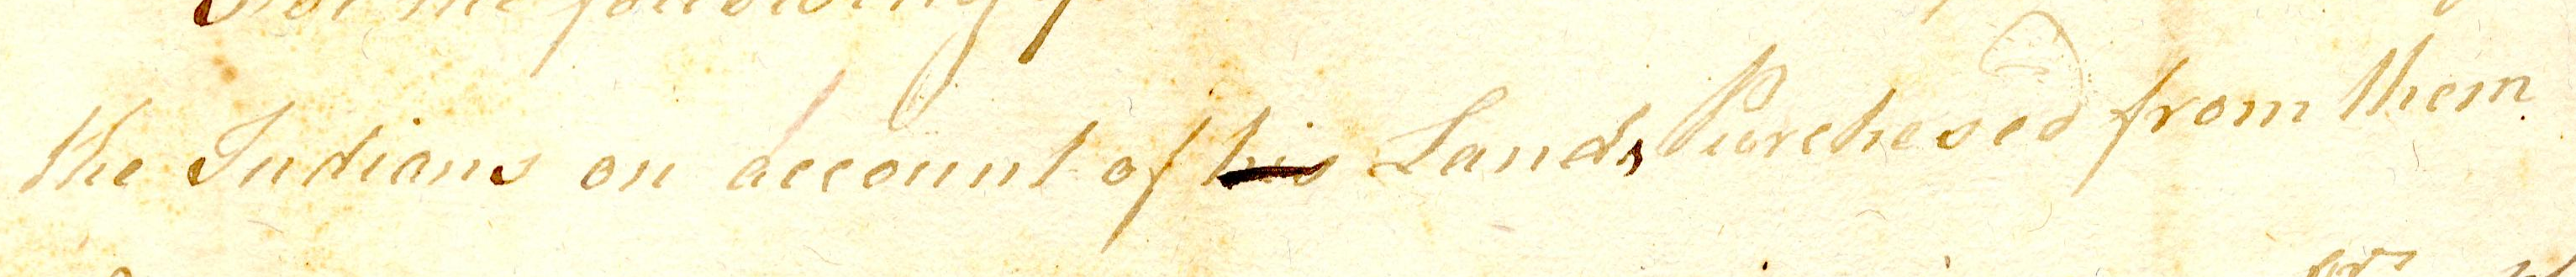the Indians on account of [his] Lands Purchesed from them
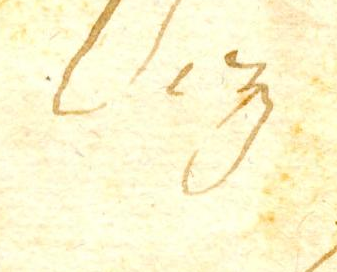Viz
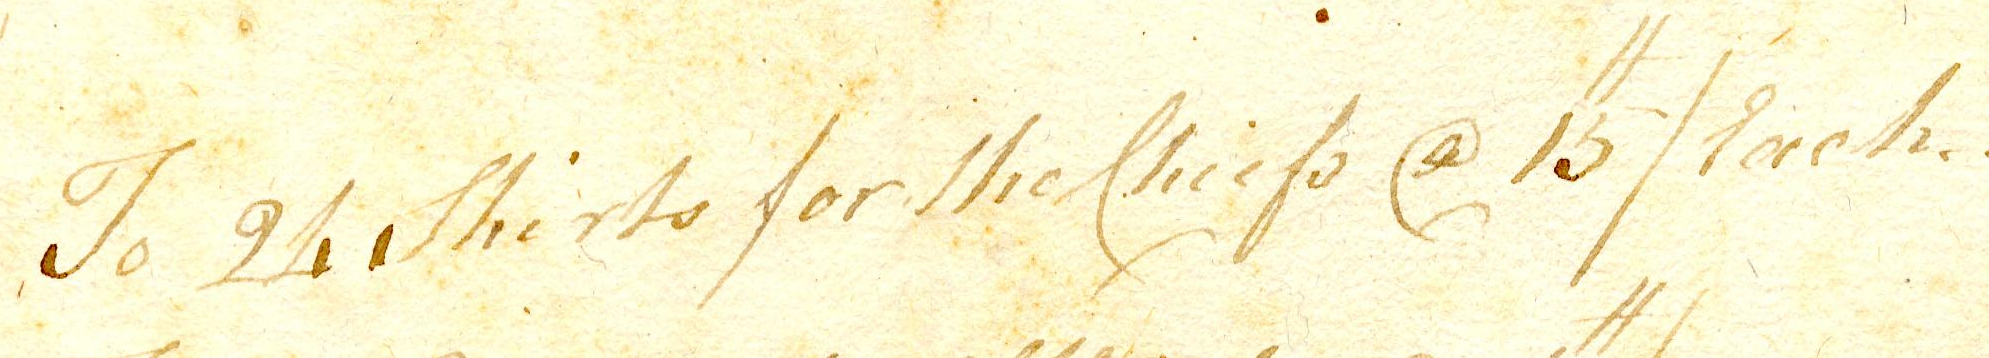To 21 Shirts for the Chiefs @ 15s each
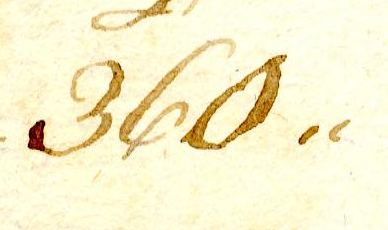360.
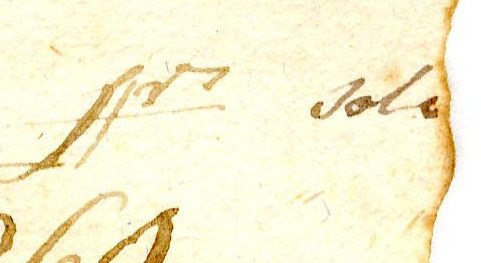£^s sold
